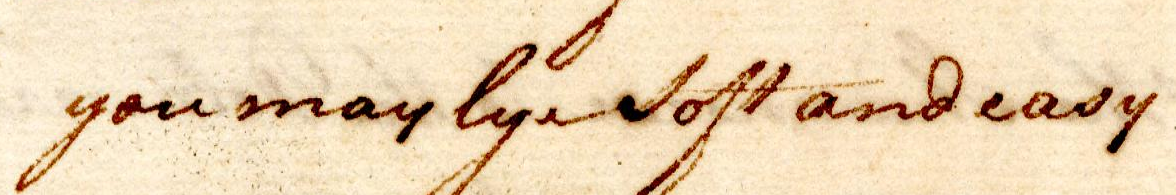you may lye Soft and easy
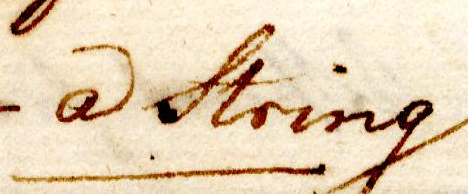- a String
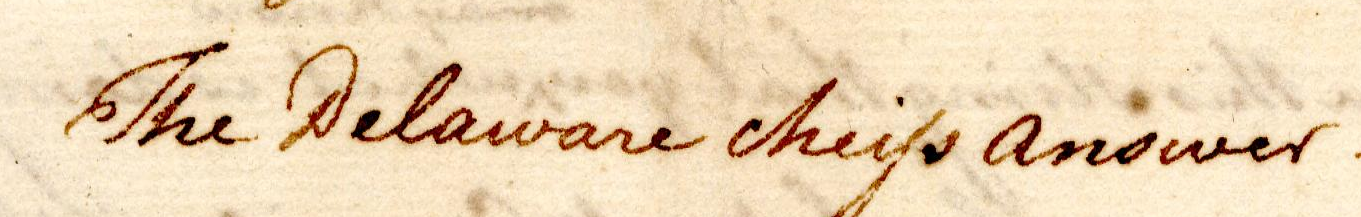The Delaware cheifs answer-
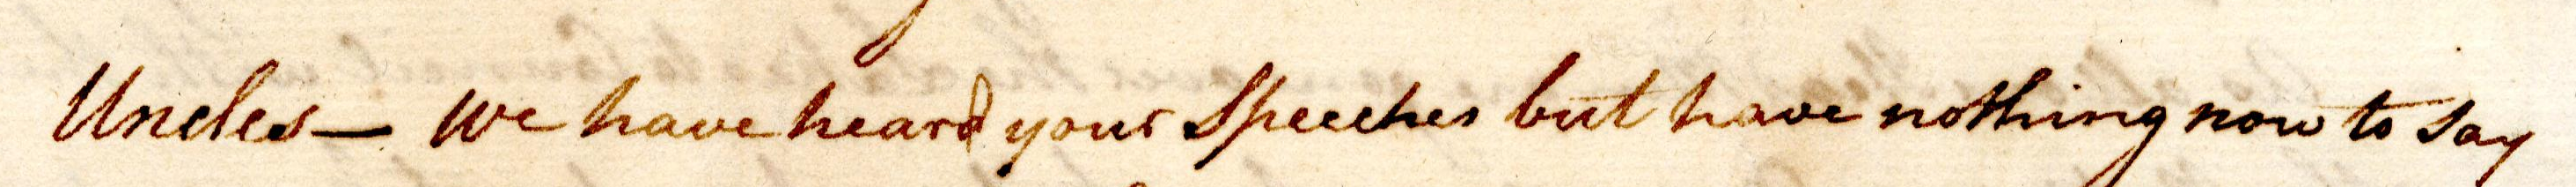Uncles- we have heard your Speeches but have nothing now to say
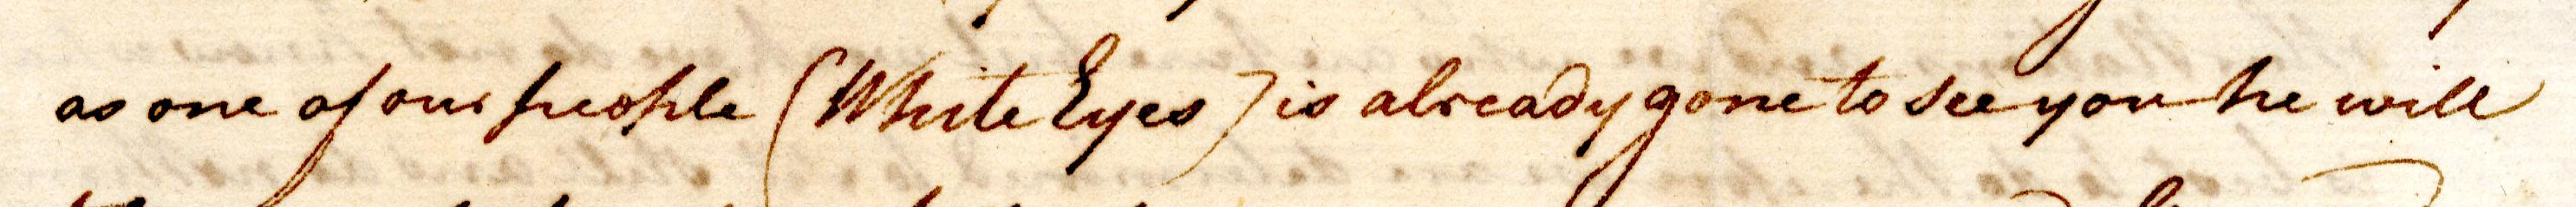as one of our people (White Eyes) is already gone to see you he will
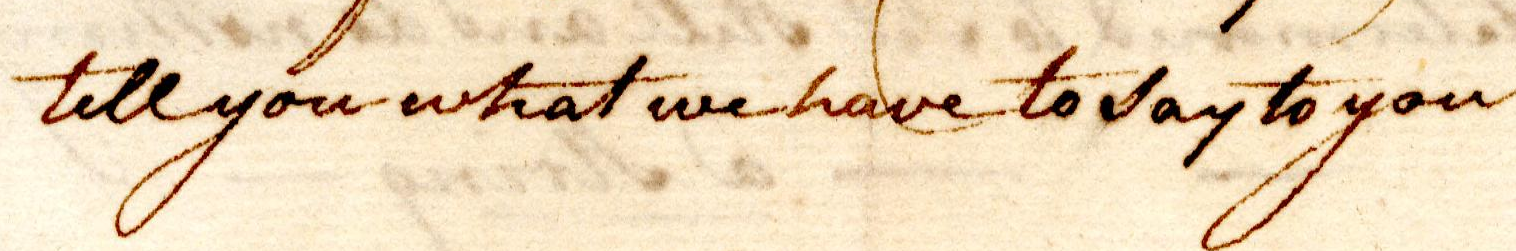tell you what we have to say to you
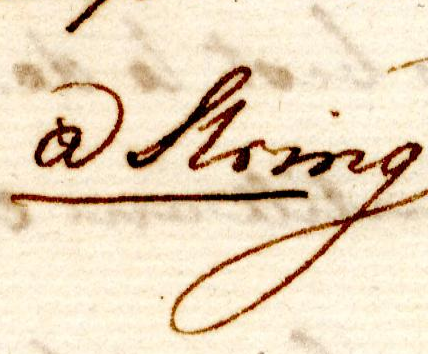a String
